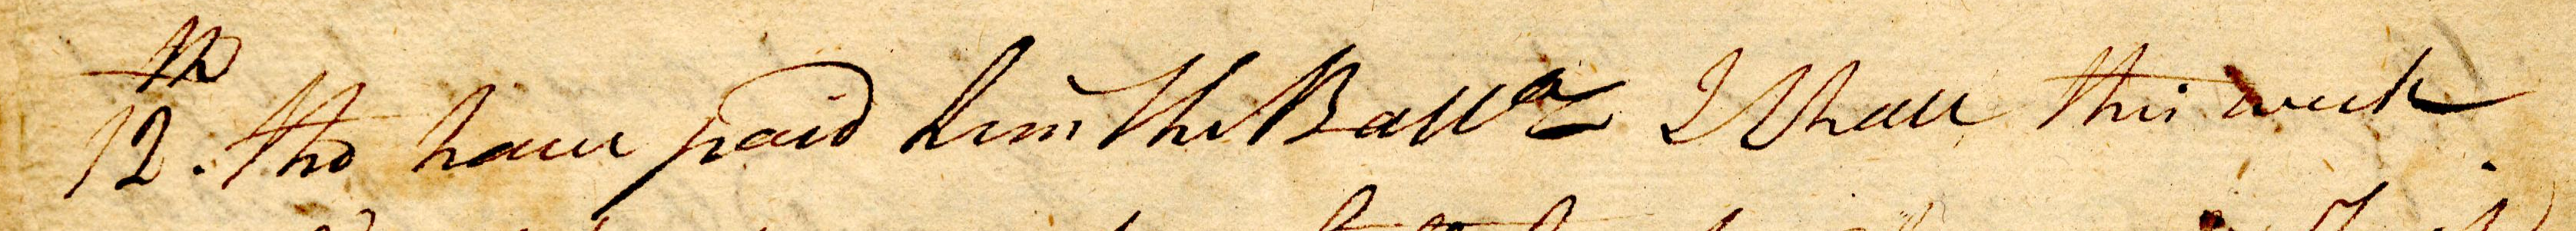12. tho have paid him the Ball^ce I shall this week
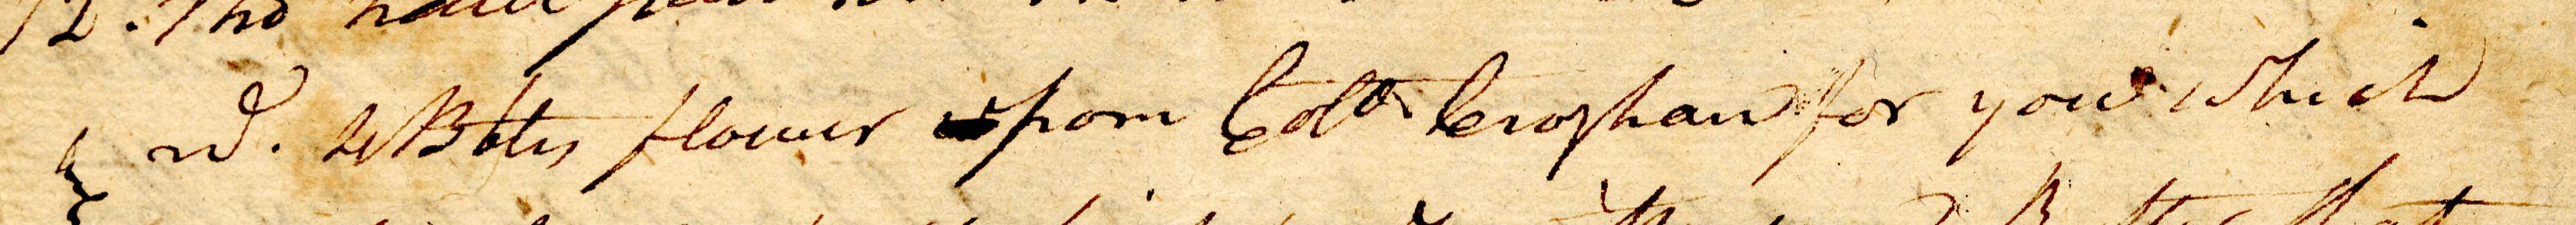rec^d. 4 bolts flower from Col^o: Croghan for you which
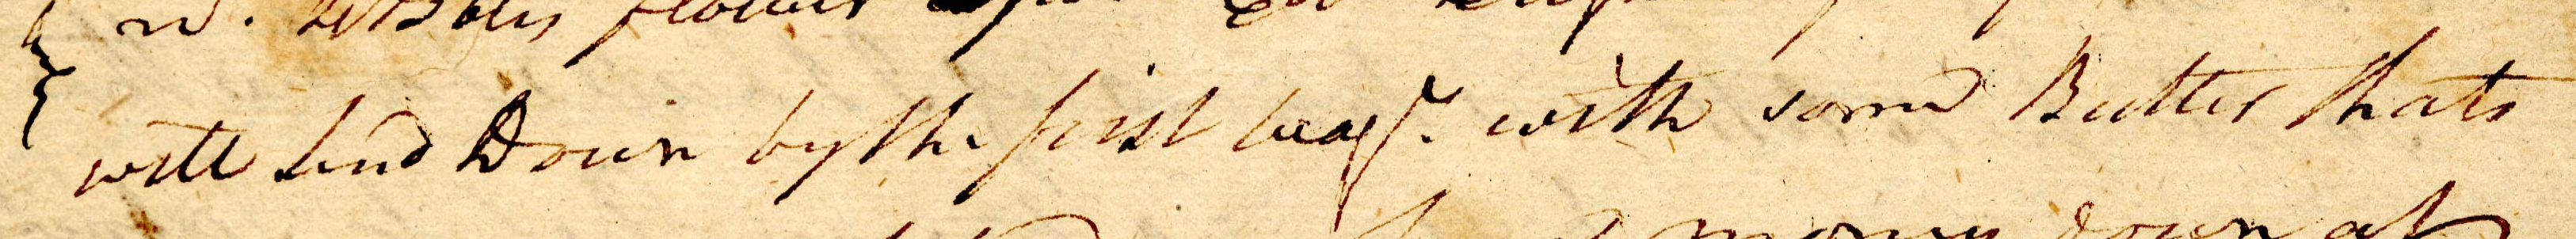will send Down by the first way^s. with some Butter thats
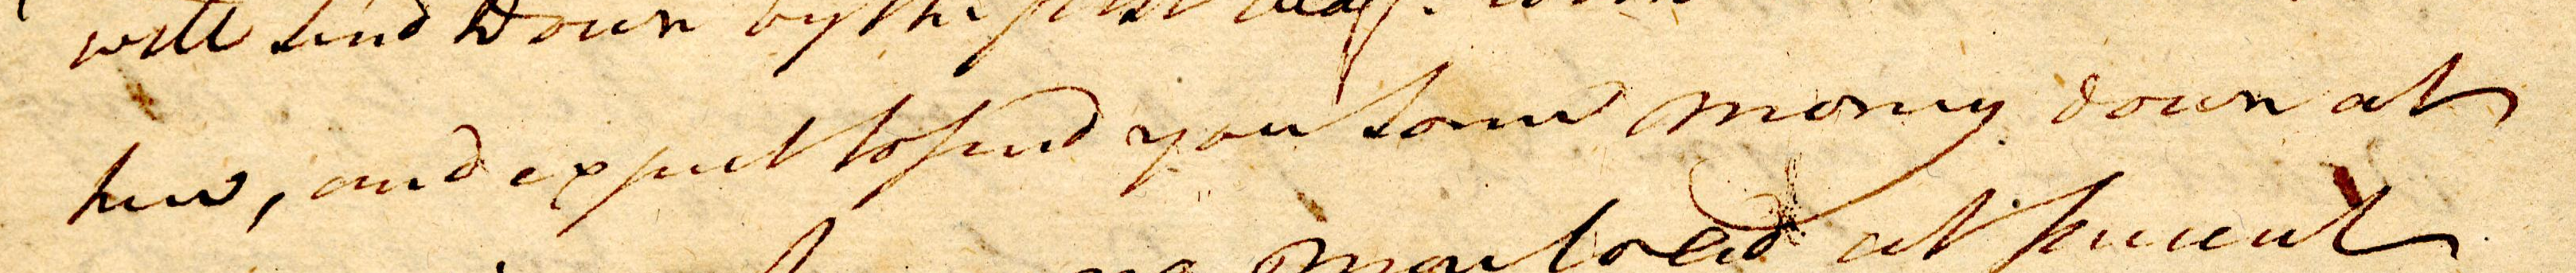here, and expect to find you Some money down at
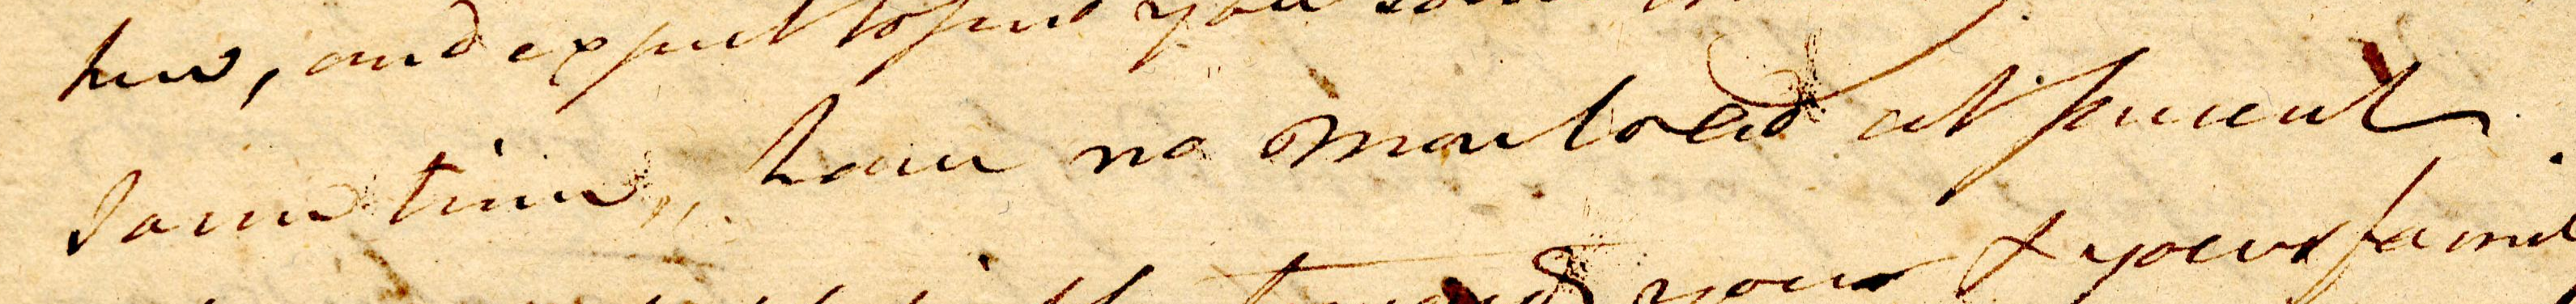Jamestown, have no martred at present
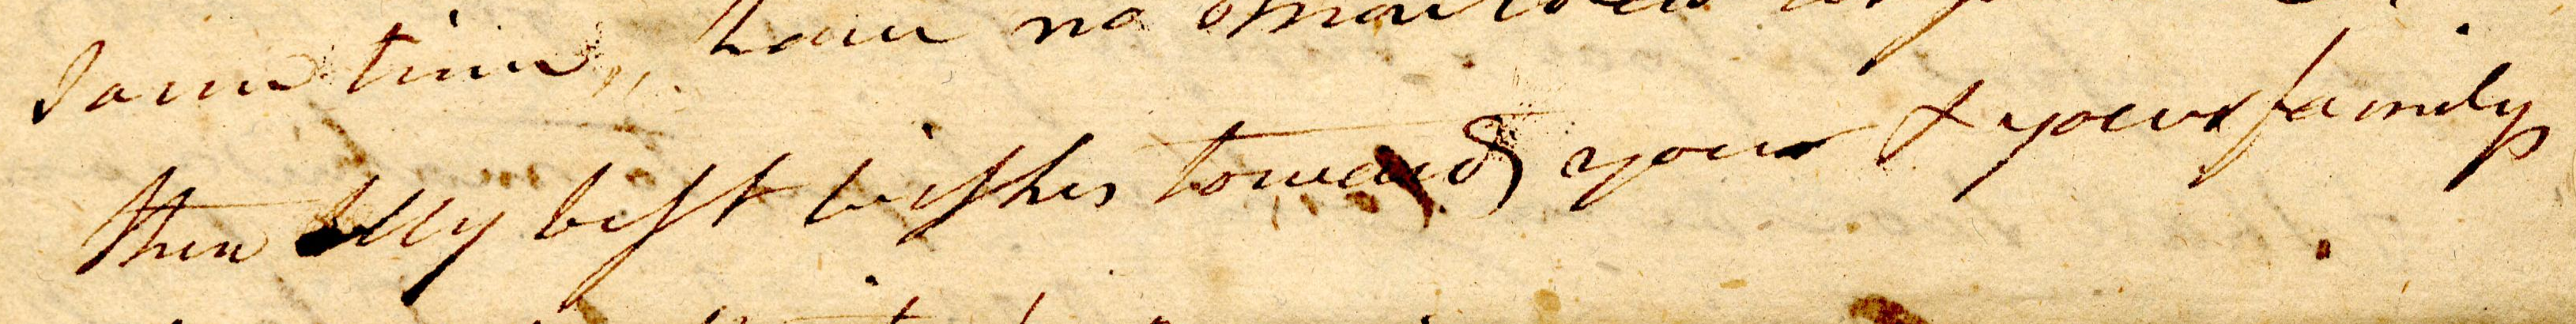then my best wishes toward you & your family
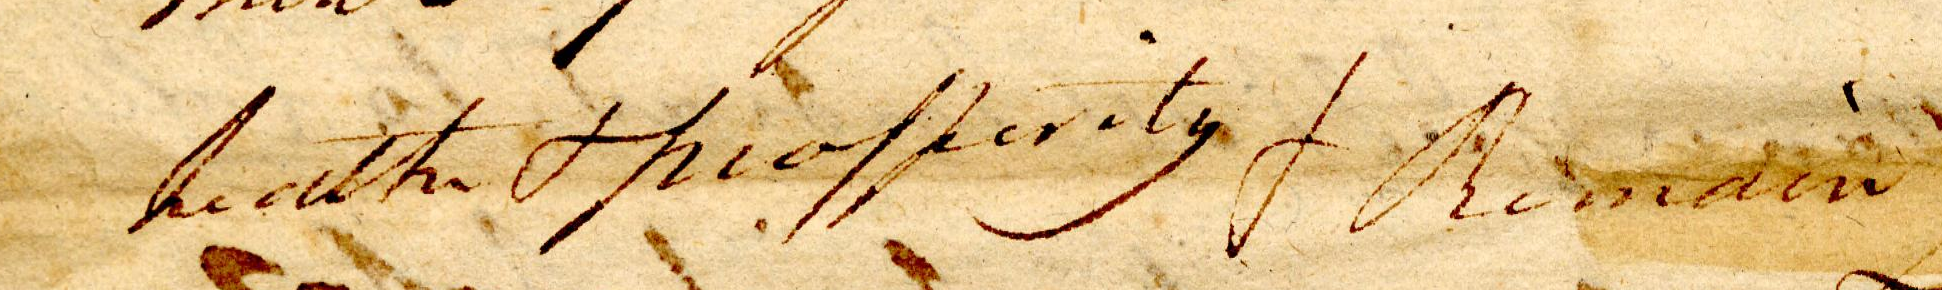health & prosperity & Remain
